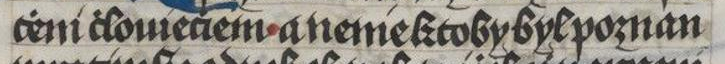ċení ċlouíeċiem.a neníe ktoby byl poznan
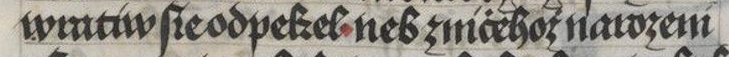wratíw ſíe odpekel.neb zníċehoż narozeni
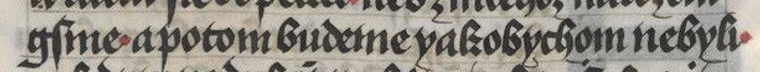gſme.a potom budeme yakobychom nebyli.
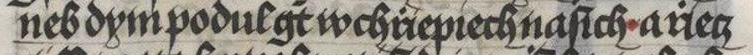neb dym podul ḡt wchṙiepíech naẛich.a ṙíecz
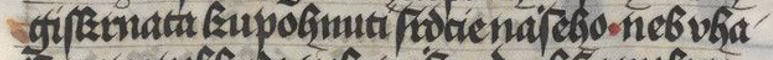gíſkrnata ku pohnutí ſrdcíe naẛeho.neb vha¬
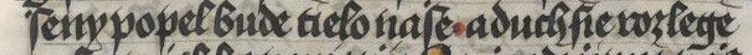ẛeny popel bude tielo naẛe.a duch ſíe rozlege
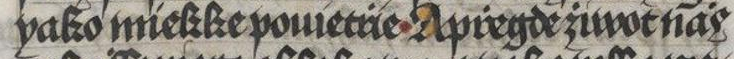yako míekke pouíetṙíe.Apṙegde żiwot naṡ
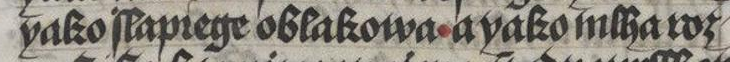yako ẛlapiege oblakowa.a yako mlha roz¬
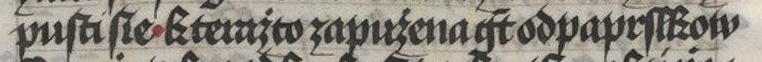puſtí ſie.kterażto zapużena ḡt odpaprſkow
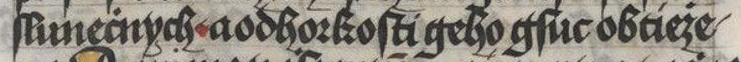ſluneċnych.a odhorkoſti geho gſuc obtíeże¬
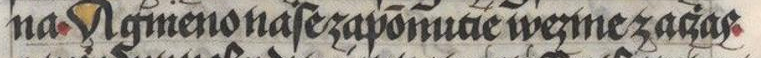na.Agmeno naẛe zapōnutíe wezme zacżas.
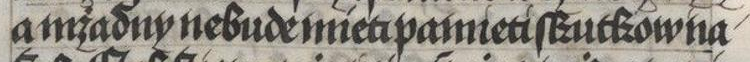a niżadny nebude míeti pamíeti ſkutkow na¬
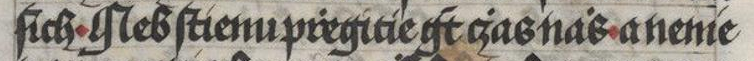ẛích.Neb ſtíenu pṙegitíe ḡt cżas naṡ. a neníe
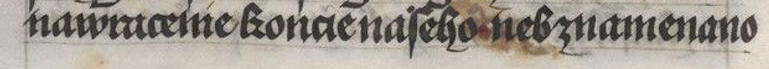nawraceníe koncie naẛeho.neb znamenano
